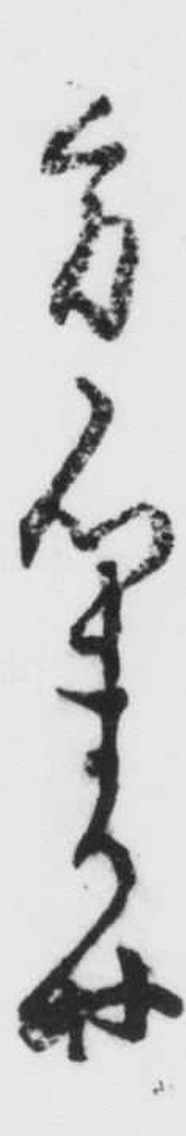方心まかせ

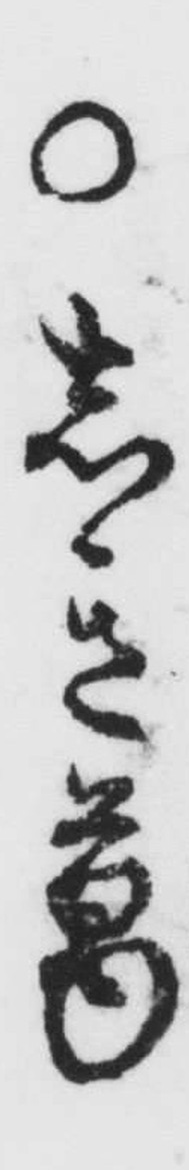○しき葛
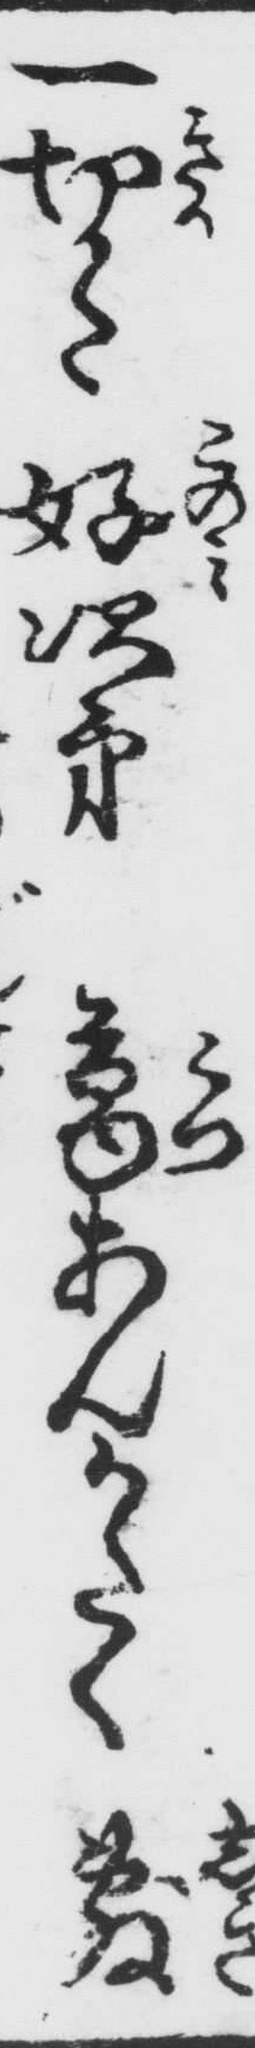一切かた好次第葛あんかたく敷
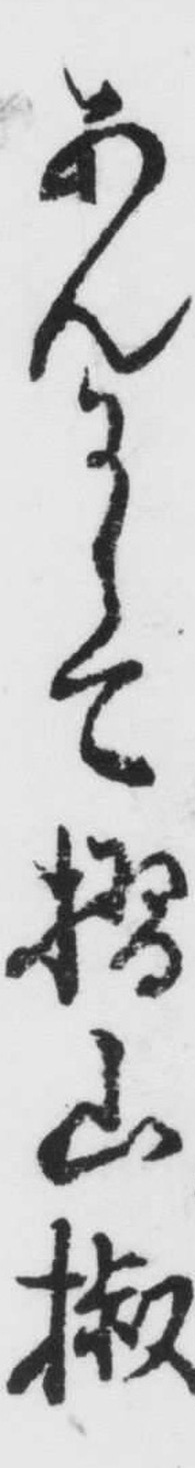あんにして摺山椒
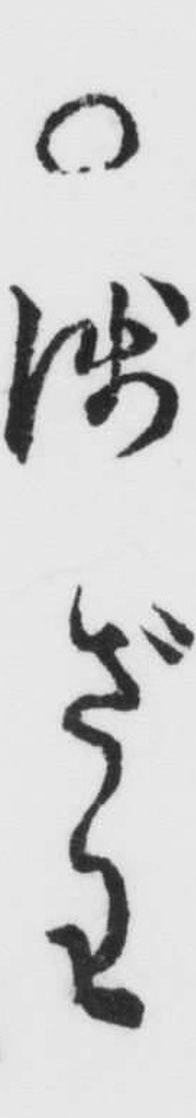○浅ざわ
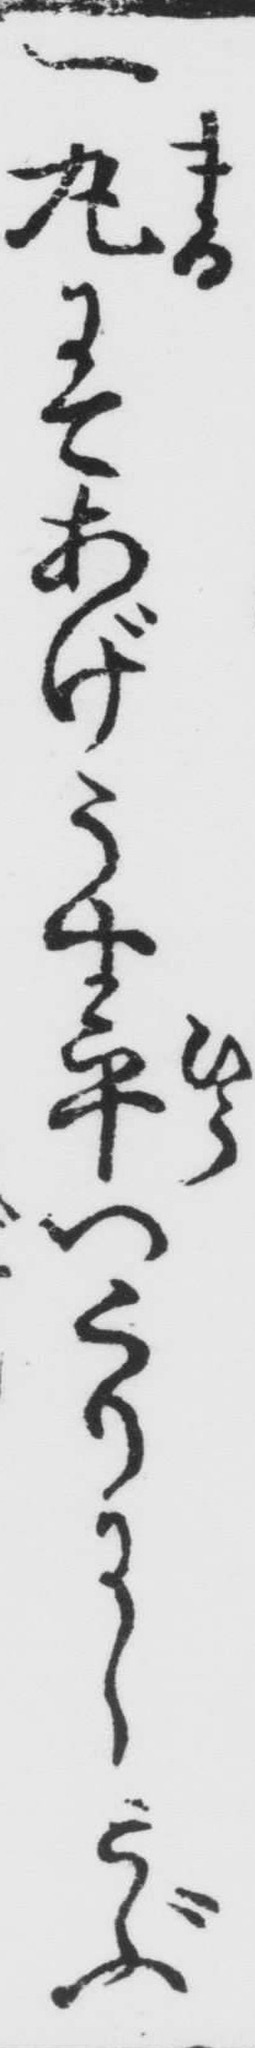一丸にてあげうす平へくりにしこぶ
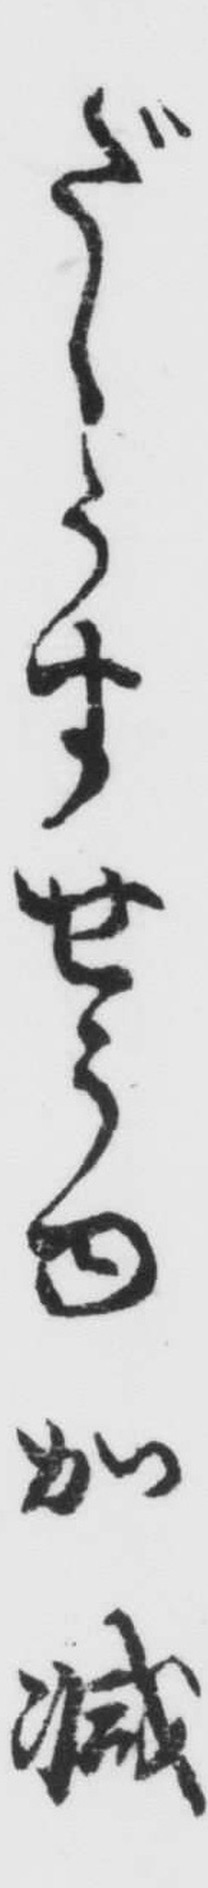だしうすせうゆ加減
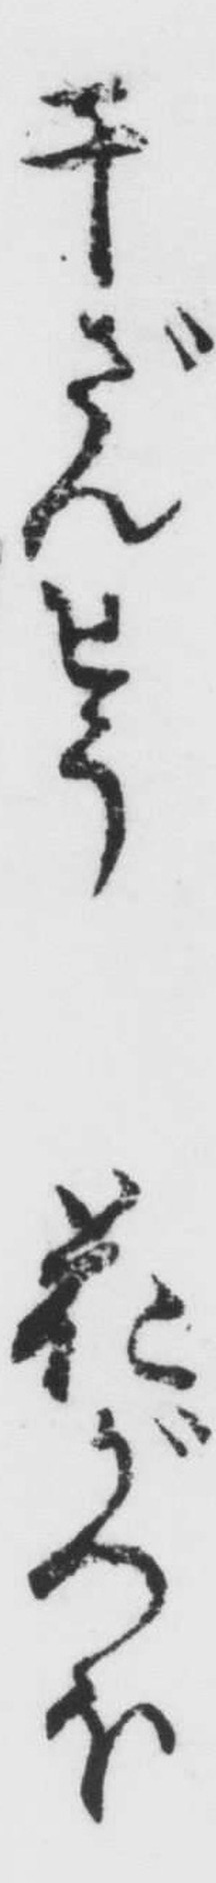干ざんせう花がつほ
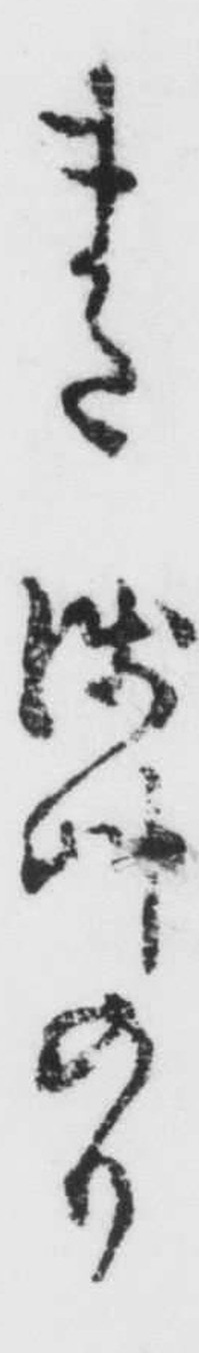また浅草のり
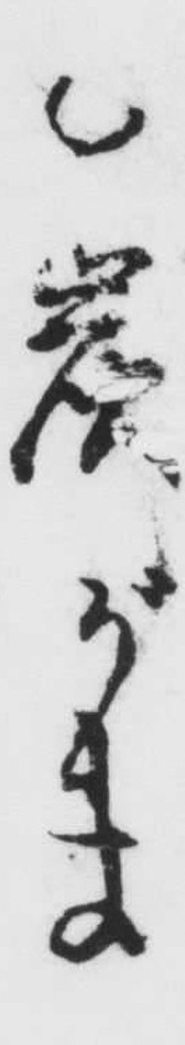○炭がま
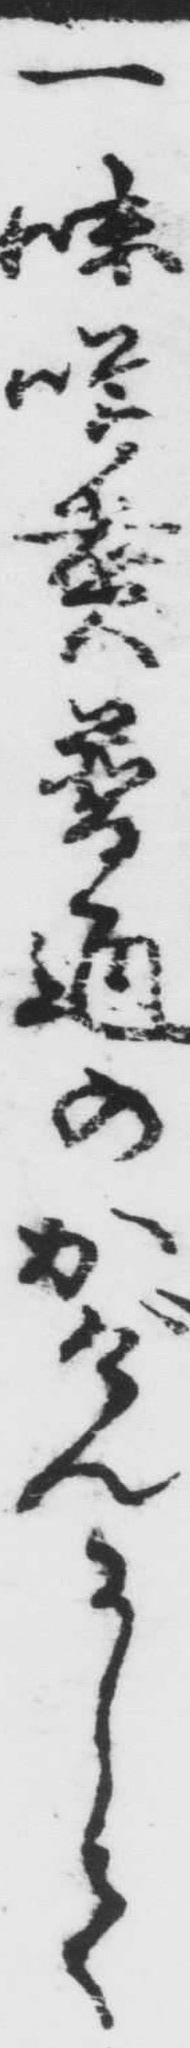一味噌煮普通のかげんにして
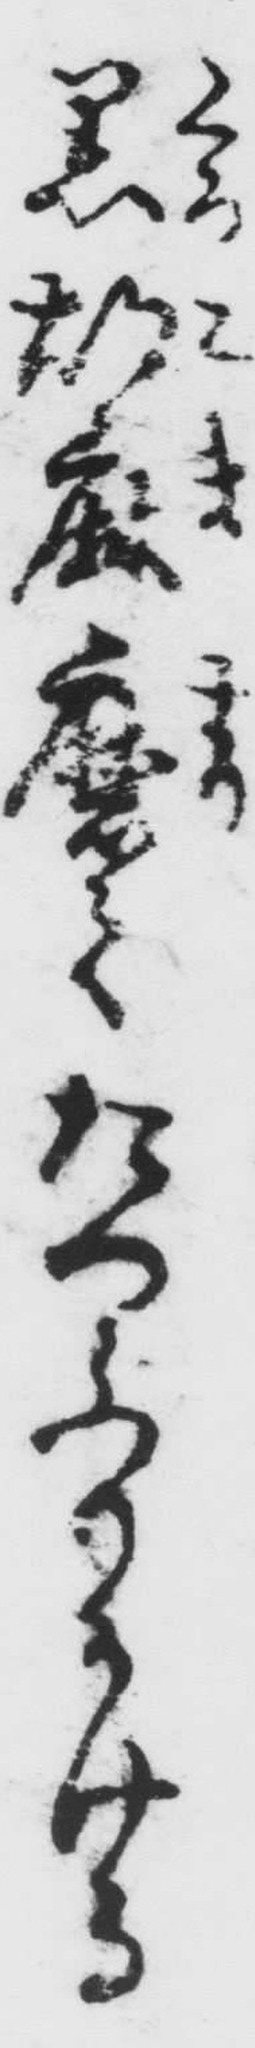黒胡麻磨てたつふりかける
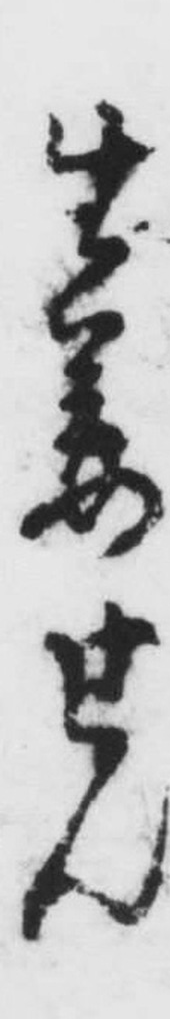生姜せん

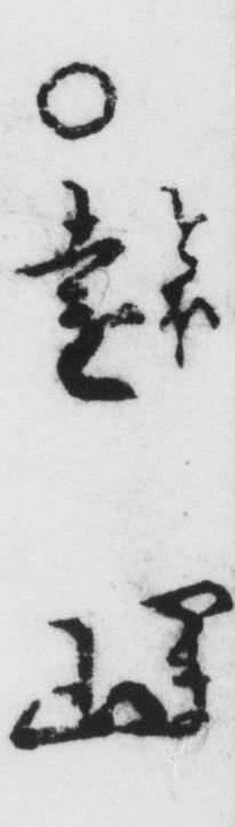○遠山
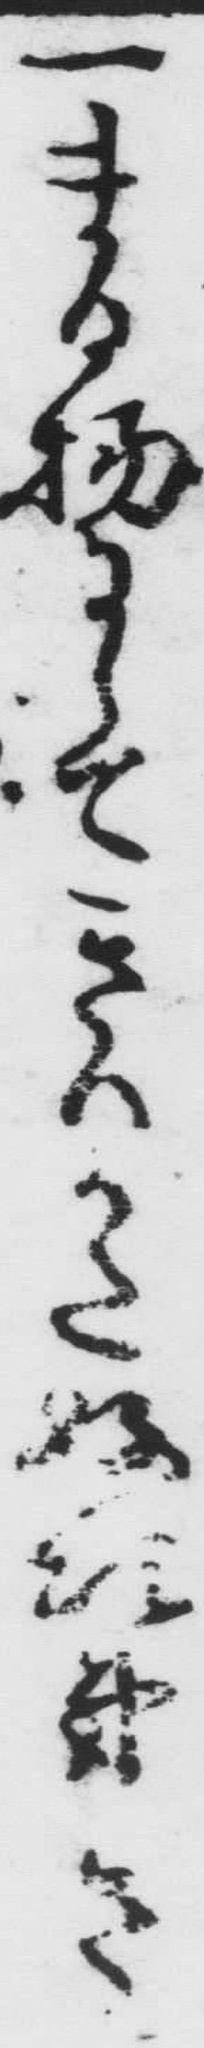一まる揚にしてきりかた好次第き
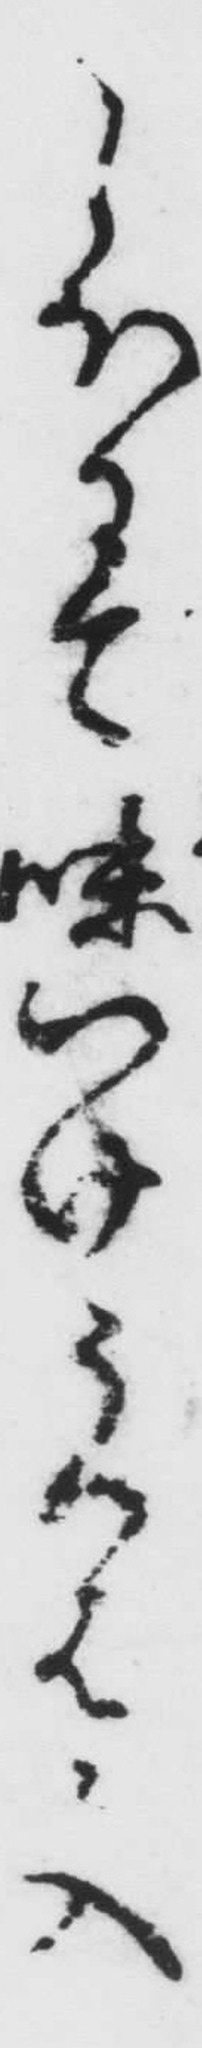しほにて味つけうつわへ入
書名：蒟蒻百珍
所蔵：大阪府立大学学術情報センター 国文学研究資料館
